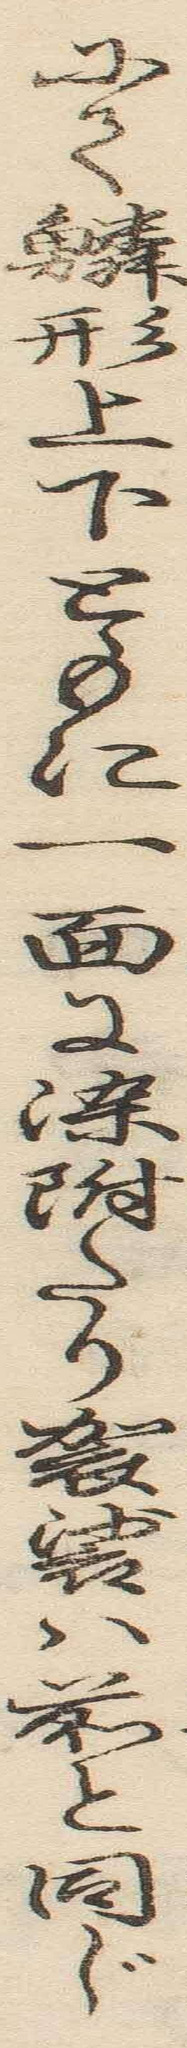にて鱗形上下ともに一面に染附たり袈裟は前と同じ
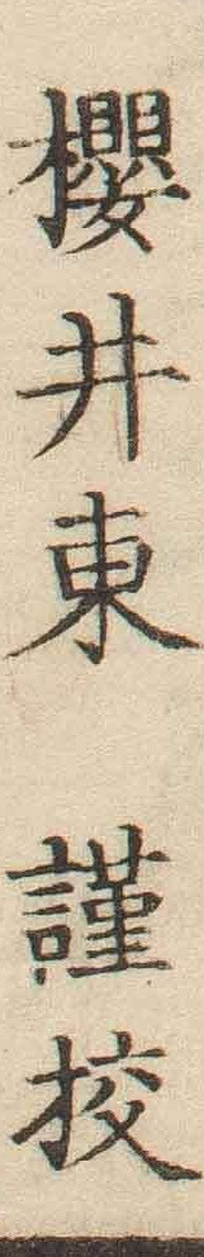櫻井東謹校
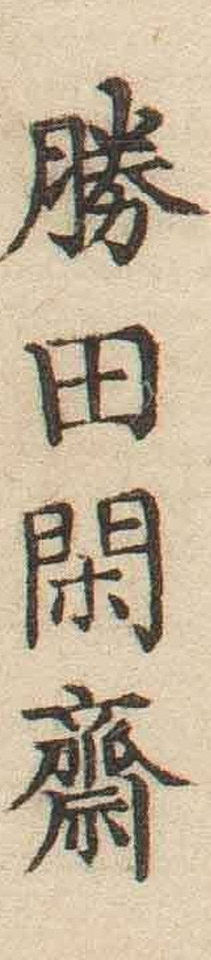勝田閑齋

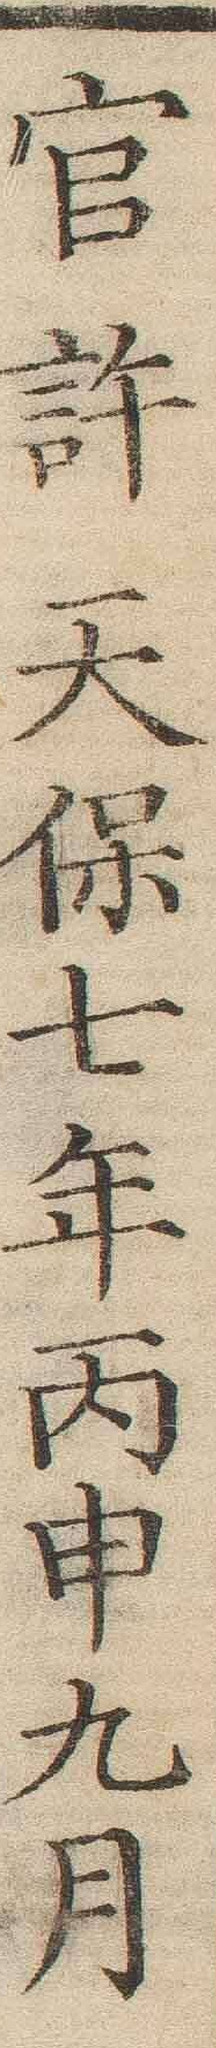官許天保七年丙申九月
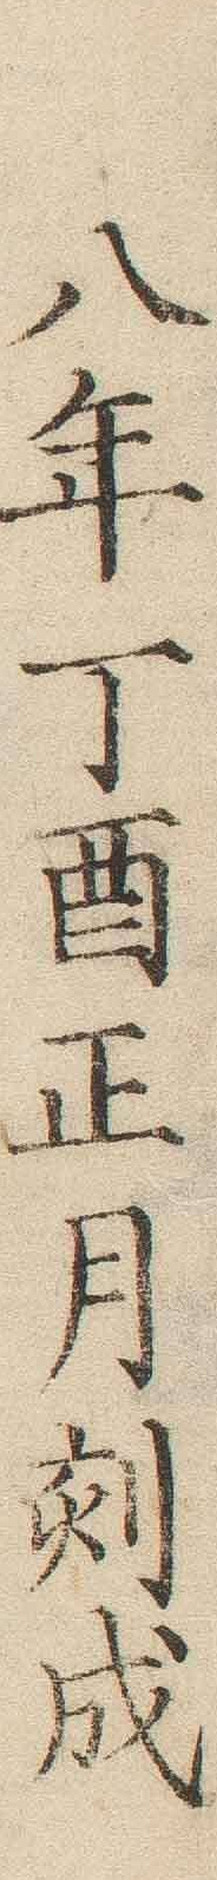同八年丁酉正月𠜇成
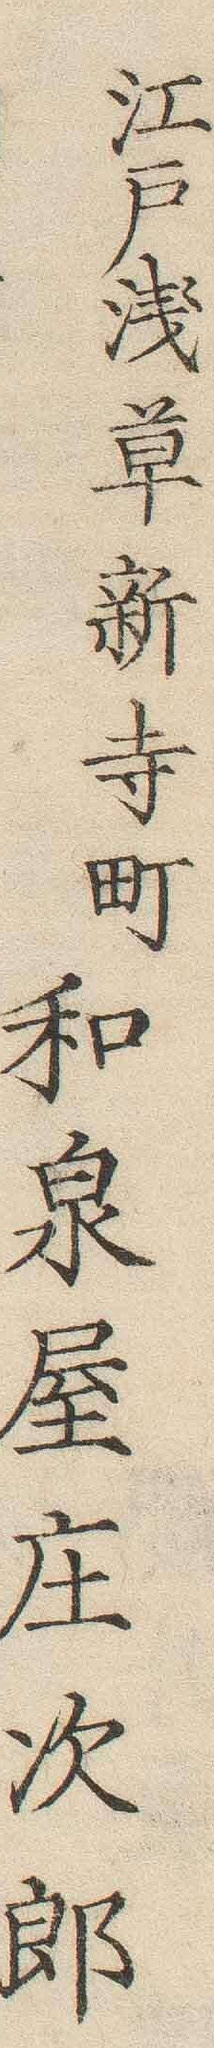江戸浅草新寺町和泉屋庄次郎
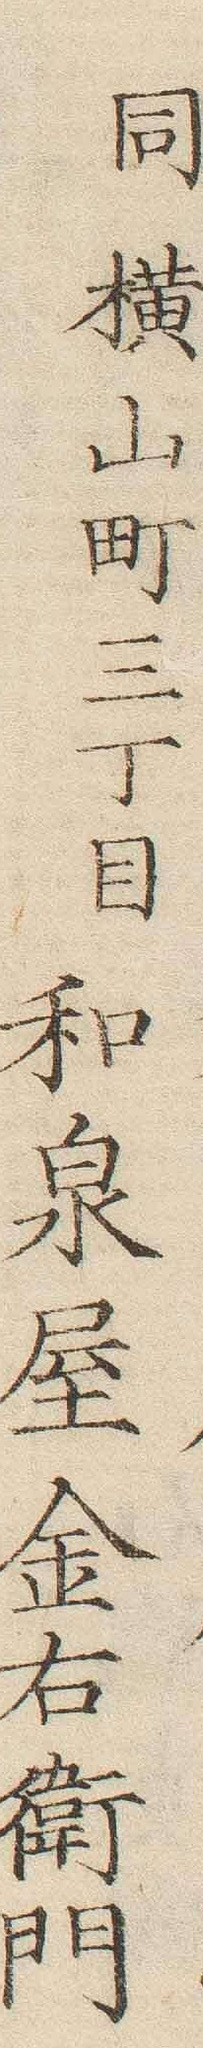同横山町三丁目和泉屋金右衛門
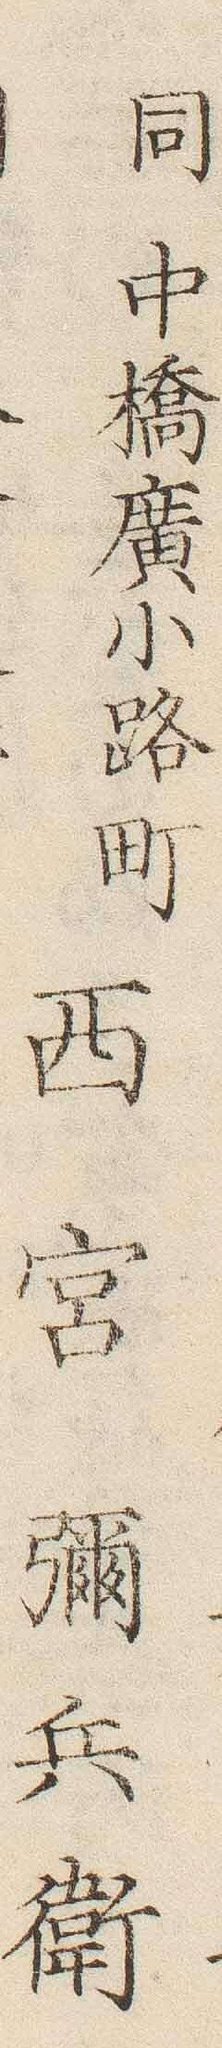同中橋廣小路町西宮彌兵衛
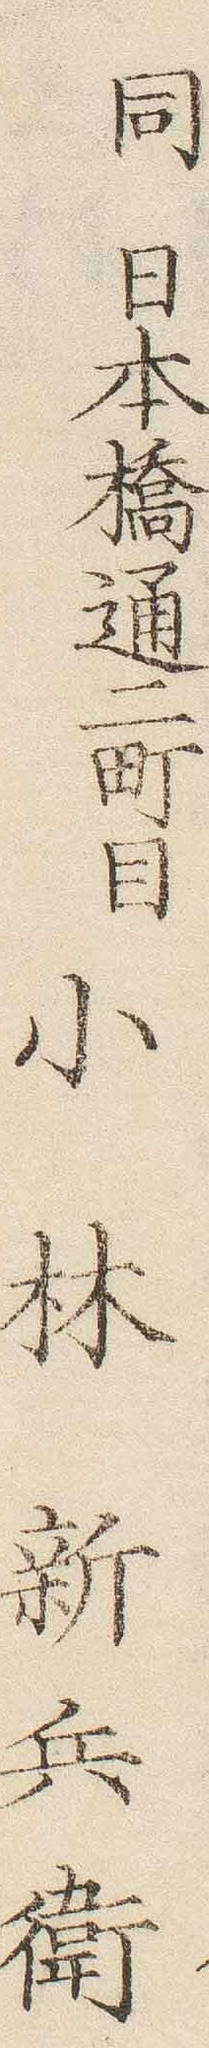同日本橋通二町目小林新兵衛
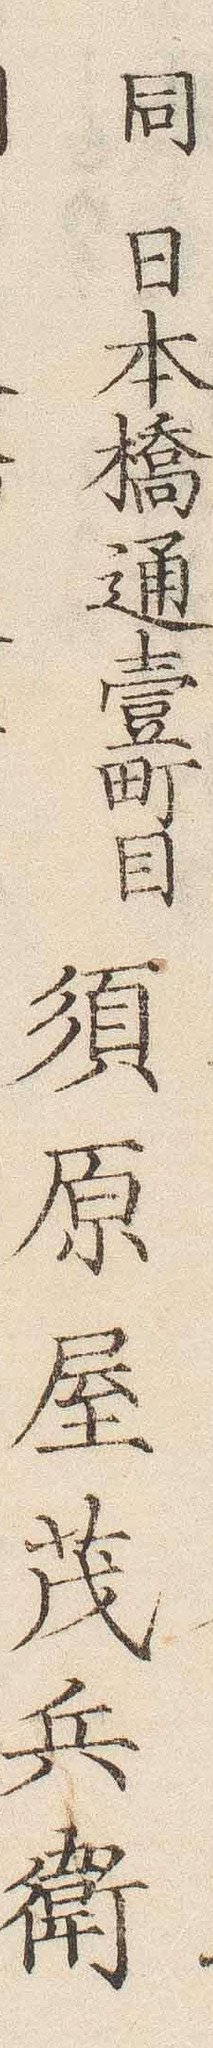同日本橋通壹町目須原屋茂兵衛
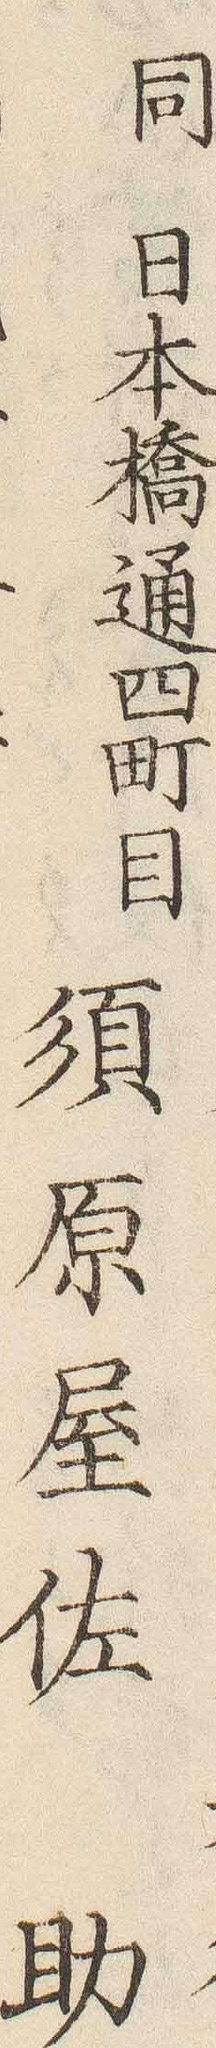同日本橋通四町目須原屋佐助
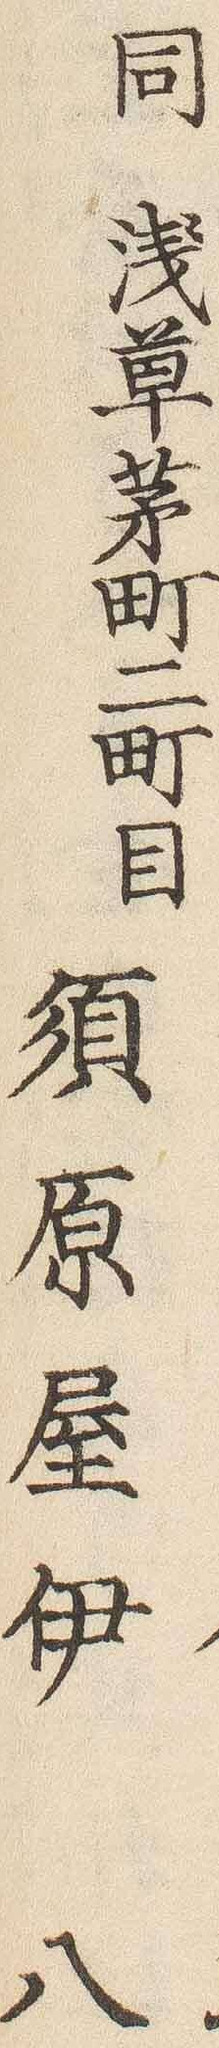同浅草茅町二町目須原屋伊八
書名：日光山志
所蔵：東京学芸大学附属図書館 国文学研究資料館
